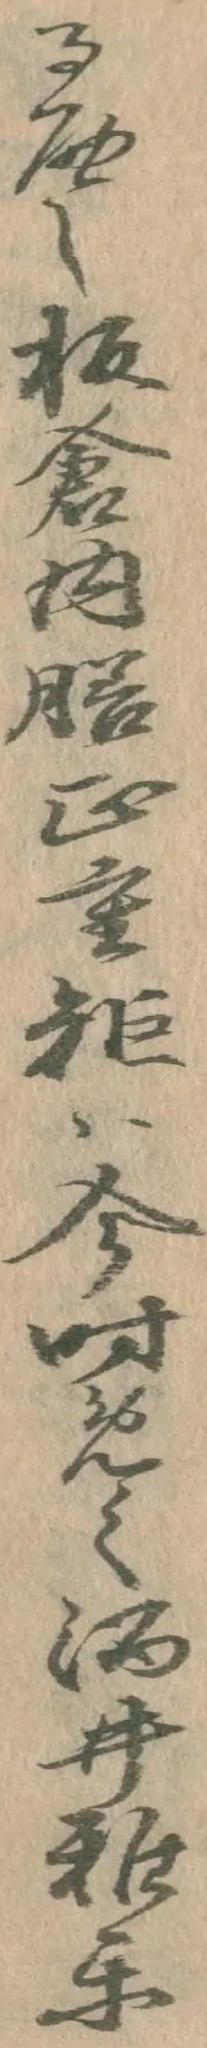る扁し板倉内膳正重矩は今時免て酒井雅楽
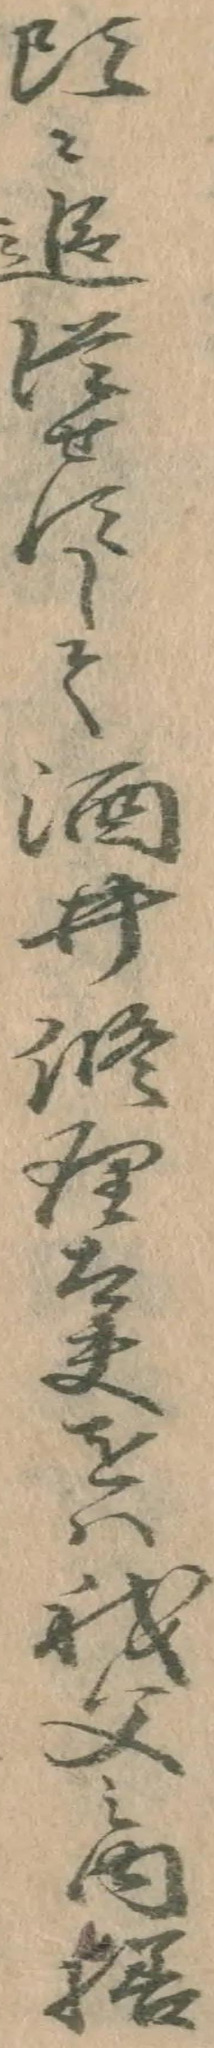頭に追従せ須して酒井修理太夫をは我父之内膳
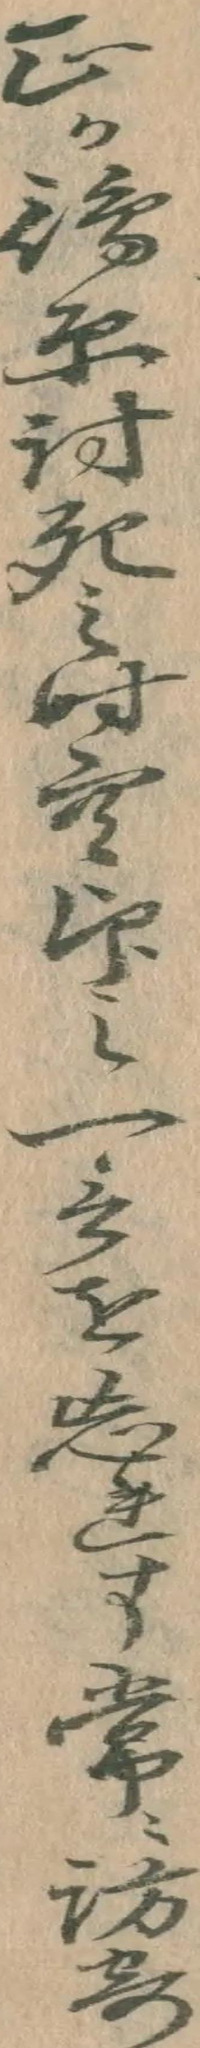正か島原討死之時空望之一云を忠連す常に防寄
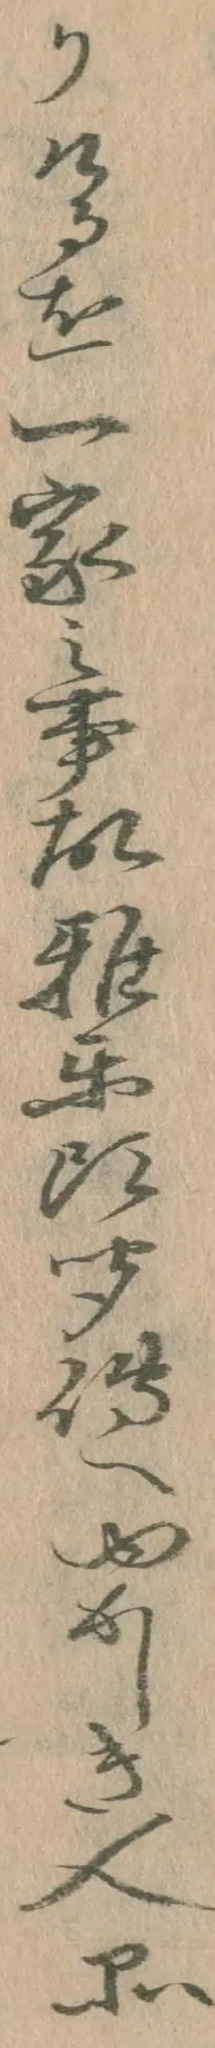りけるを一家之事故雅楽頭聞伝へゆかしき人品
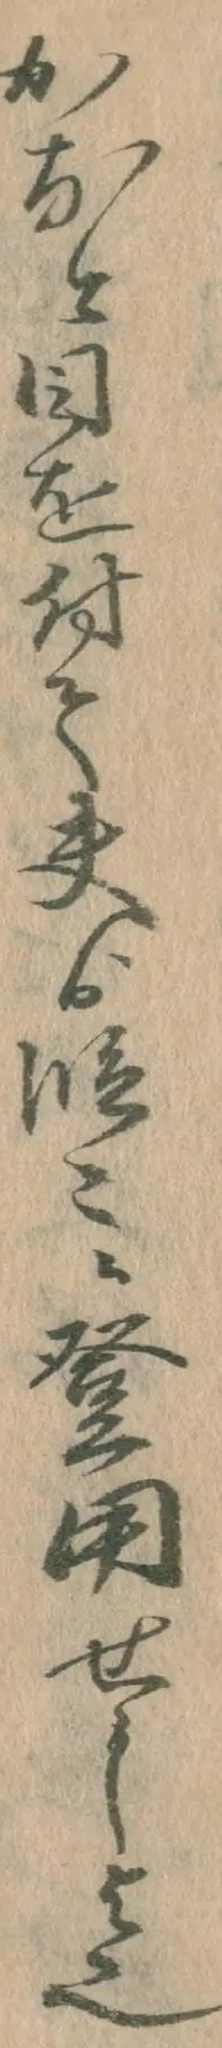かなと目を付て夫ゟ段々に登用せし与也
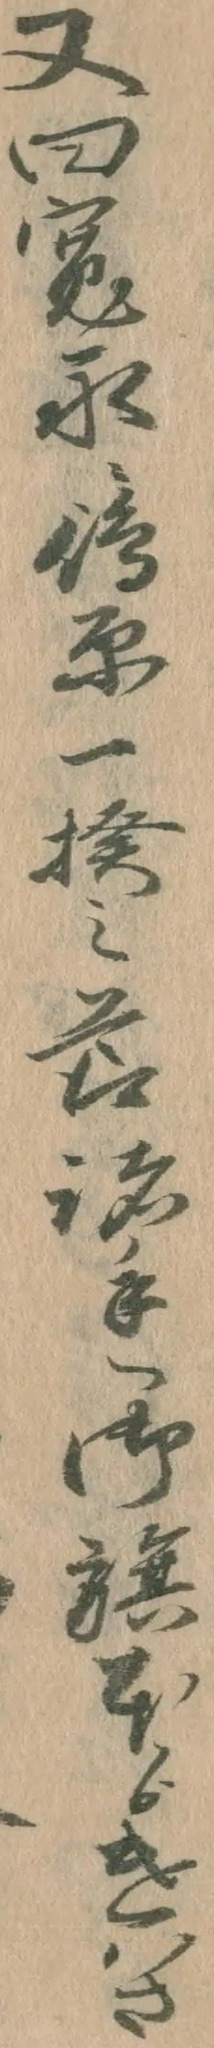又曰寛永に島原一揆之節諸手へ御旗本ゟ遣はさ
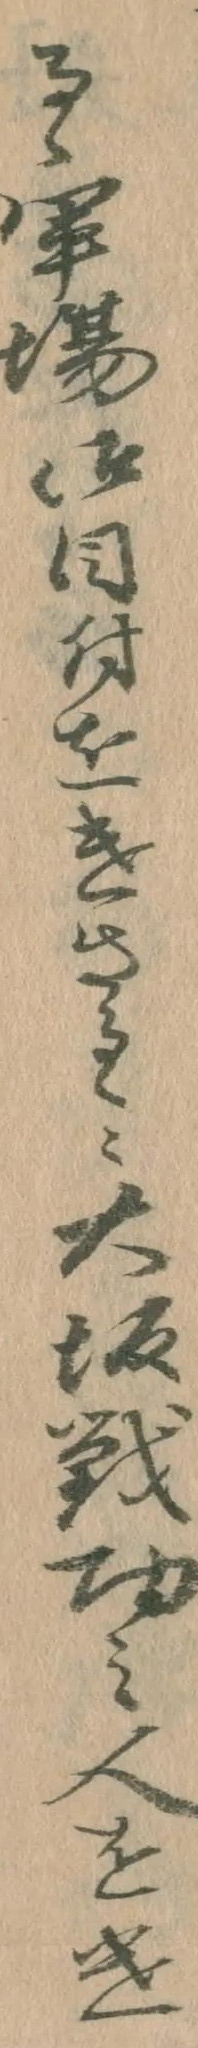るゝ軍場御目付を遣さるゝに大坂戦功之人を遣
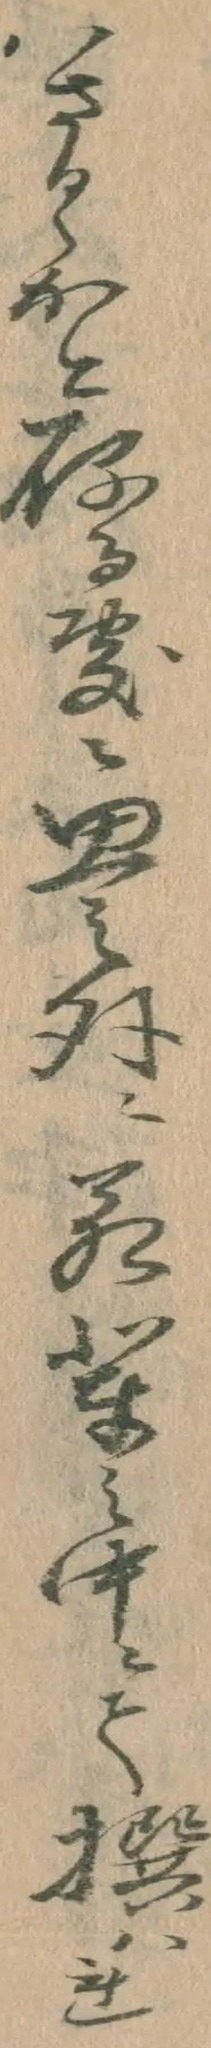はさるゝかと存る處に思之外に若輩之中にて撰は連
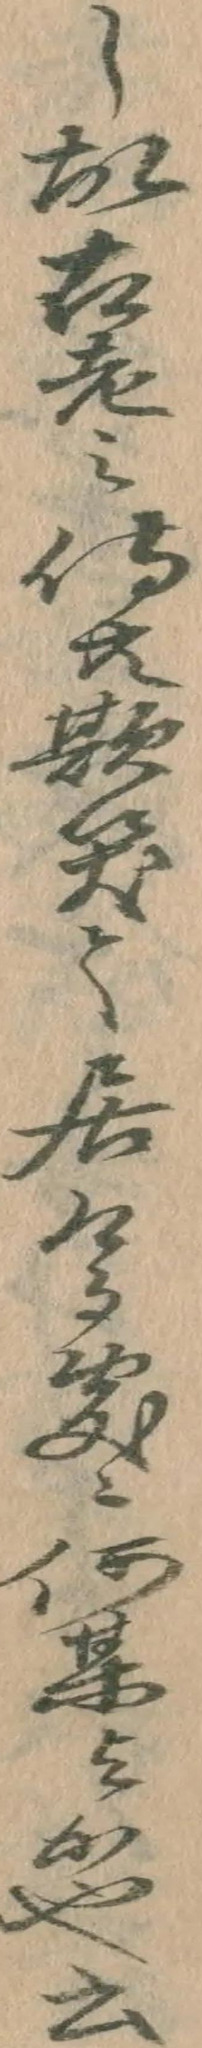し故古老之侍共欺笑て居ける處に何某与かや云
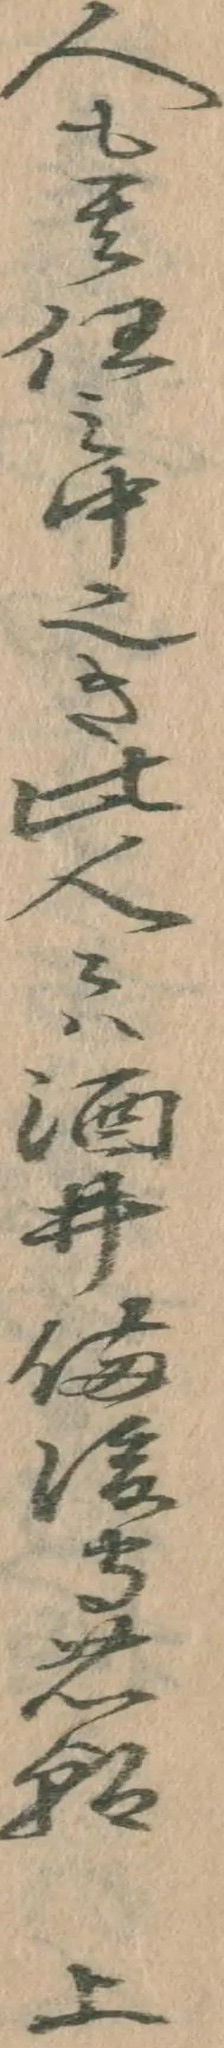人も其任之中也き此人には酒井備後守忠朝上
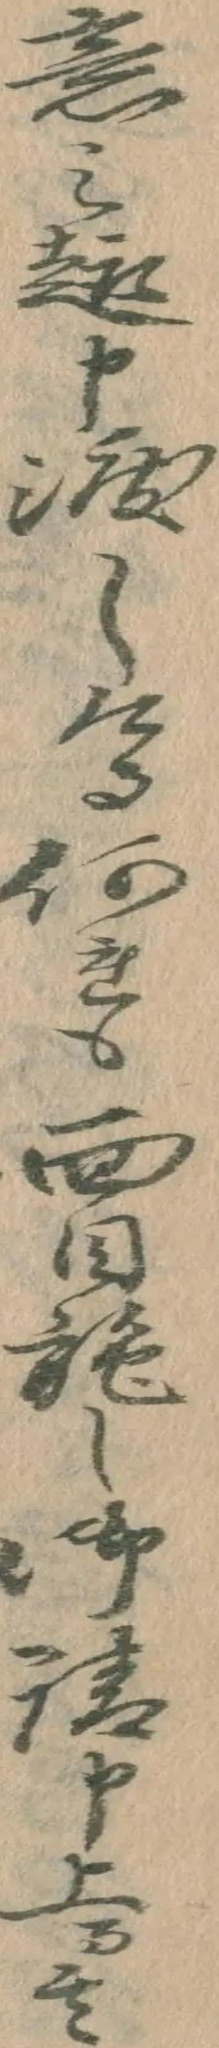意之趣申渡しける何連も西目施し御請申上而其
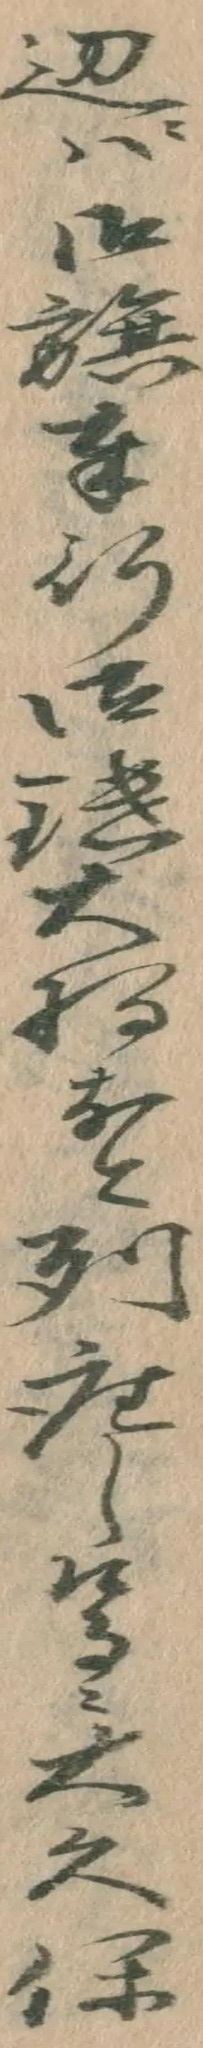辺には御籏奉行御鑓大将なと列座しけるに大久保
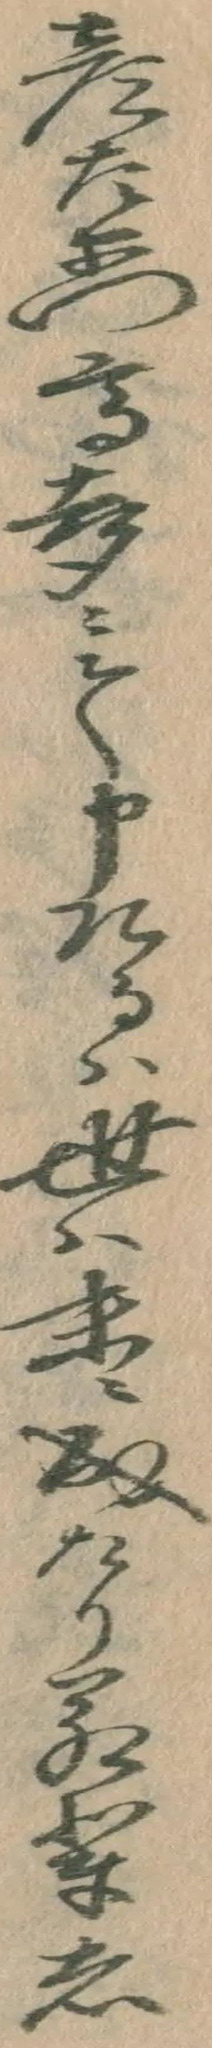彦左衛門高声にて申たるは世は末に成たり若輩者
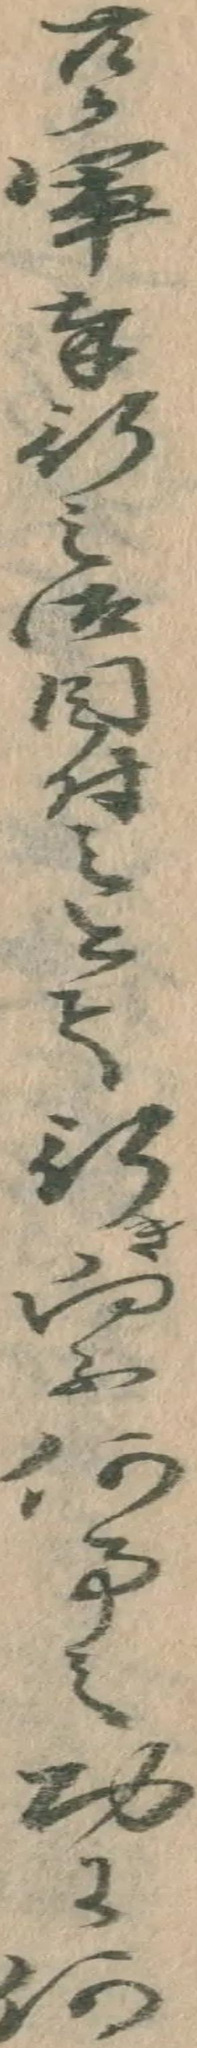共か軍奉行之御目付之とて行き向ふ何事之功尓何
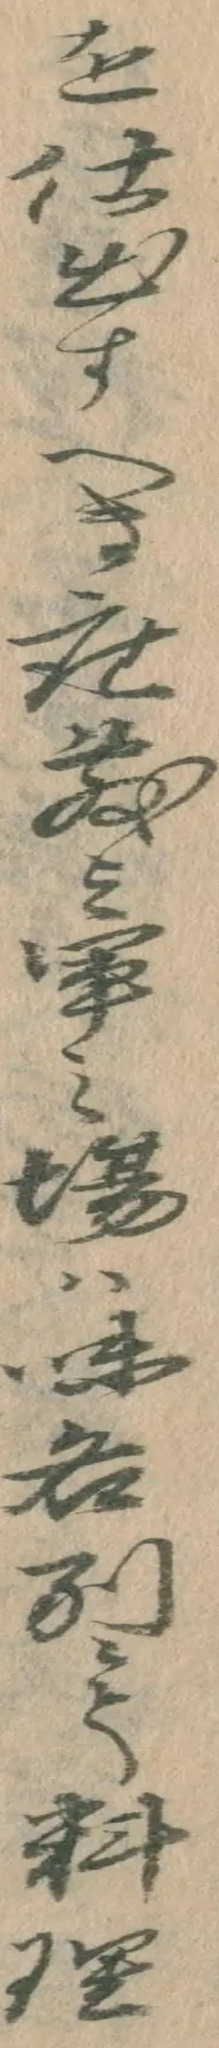を仕出すへき座敷与軍之場は味各別にて料理
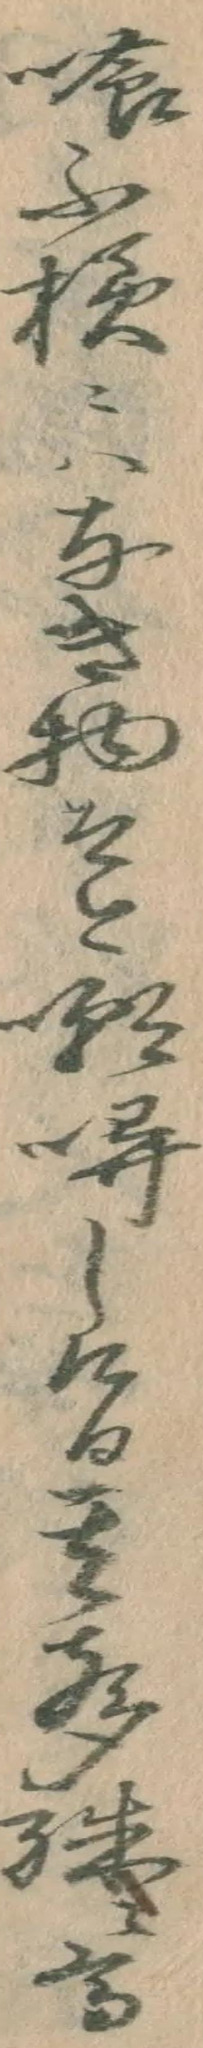喰ふ様にはなき物そと嘲哢しける其声殊に高
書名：切支丹御退治記 49巻. [2]
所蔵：国立国会図書館 National Diet Library, JAPAN
